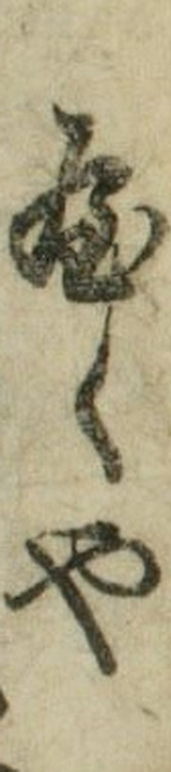やくや
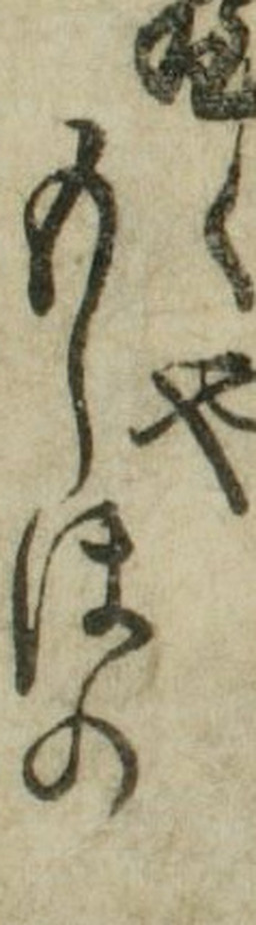もしほの

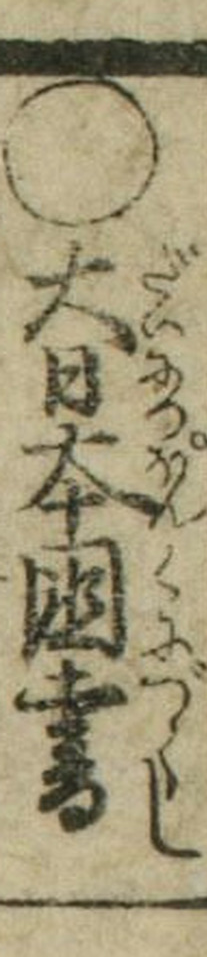○大日本国尽
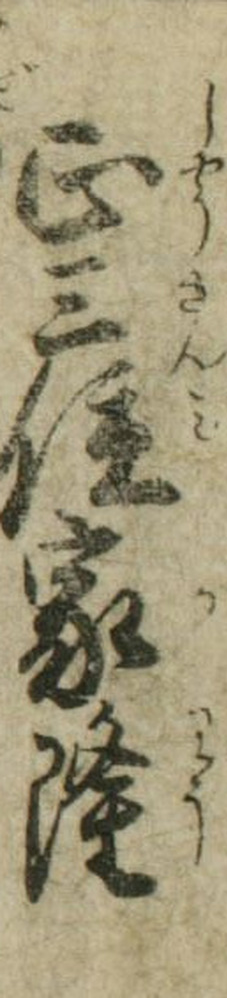正三位家隆
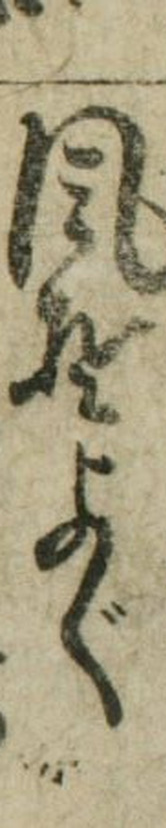風そよぐ
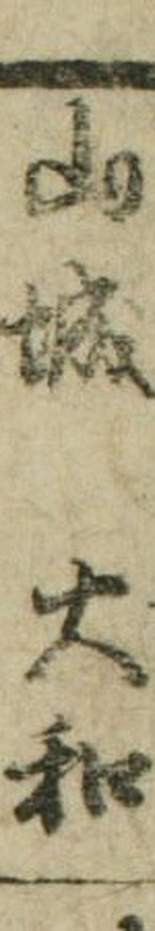山城大和
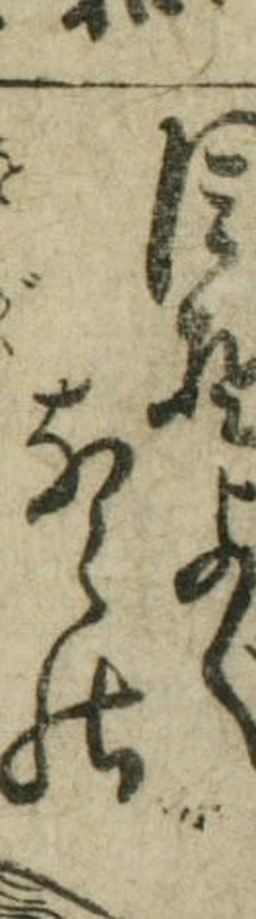ならの
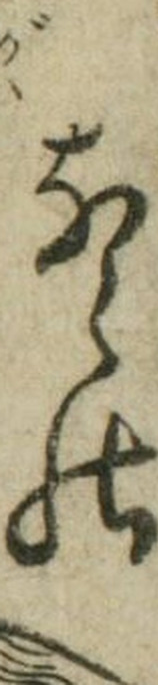ならの
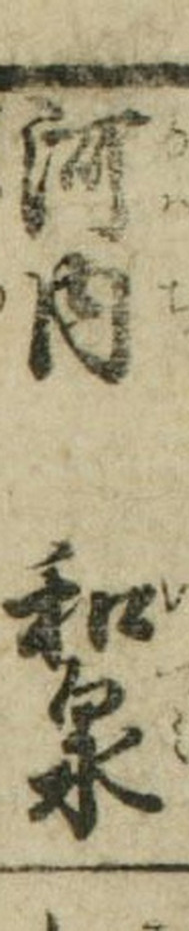河内和泉
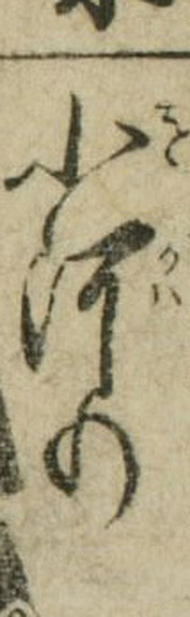小河の
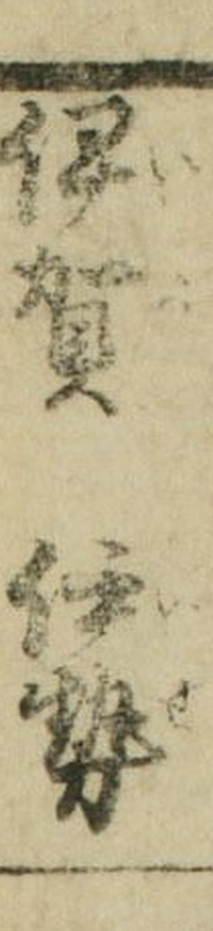伊賀伊勢
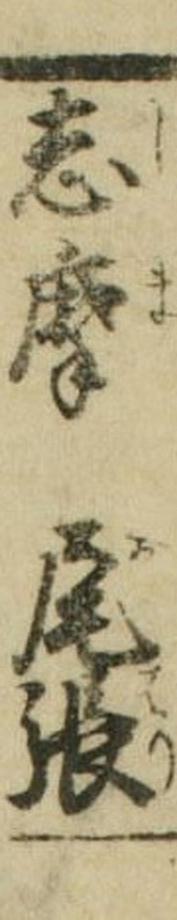志摩尾張
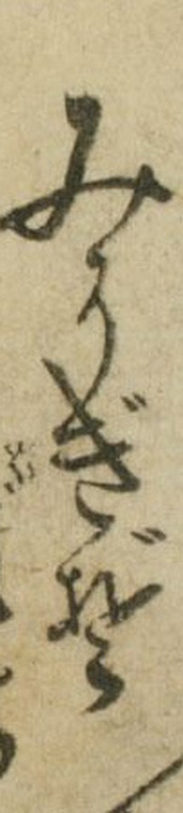みそぎぞ
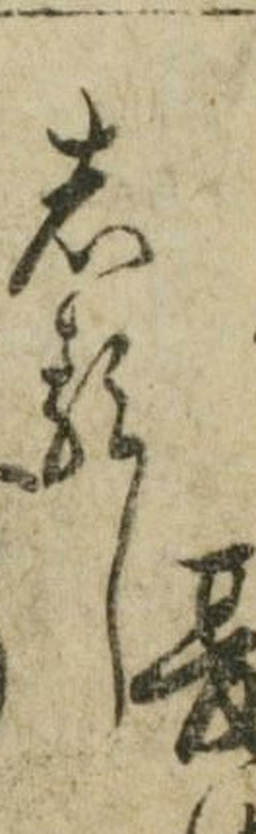しるし
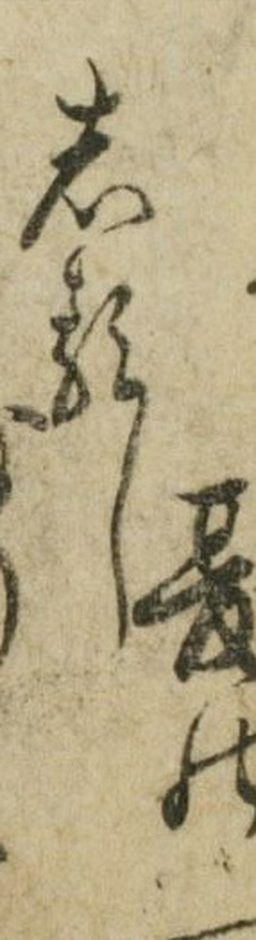しるし
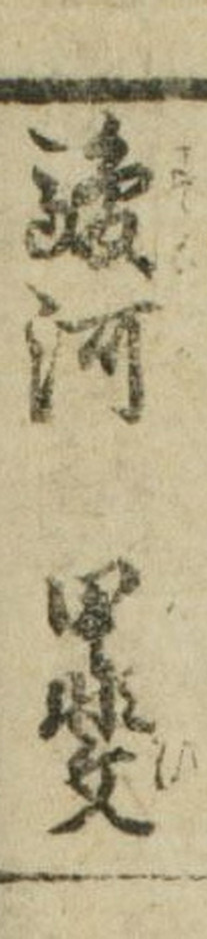駿河甲斐
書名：百人一首
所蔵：東京学芸大学教育コンテンツアーカイブ
